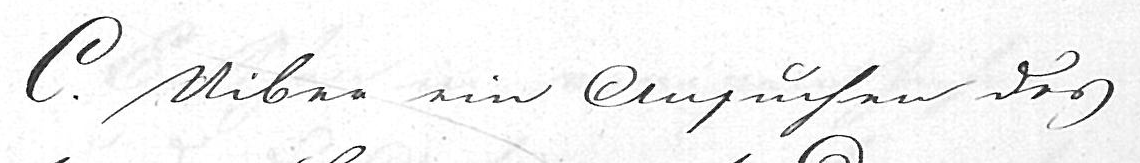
C. Uiber ein Ansuchen des
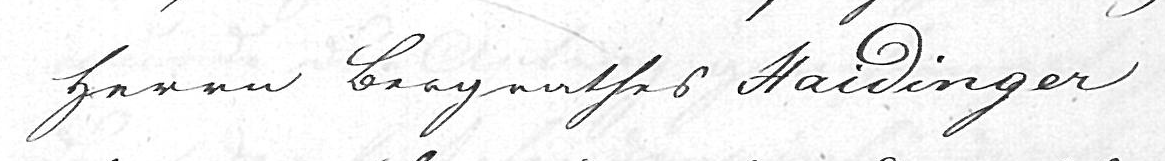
Herrn Bergrathes Haidinger
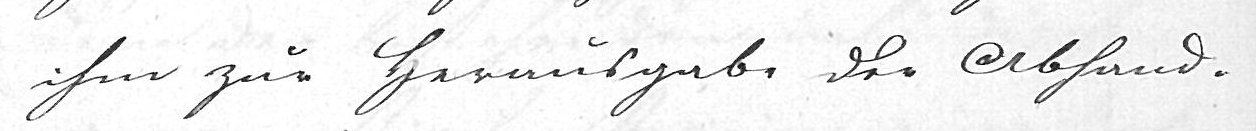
ihm zur Herausgabe der Abhand-
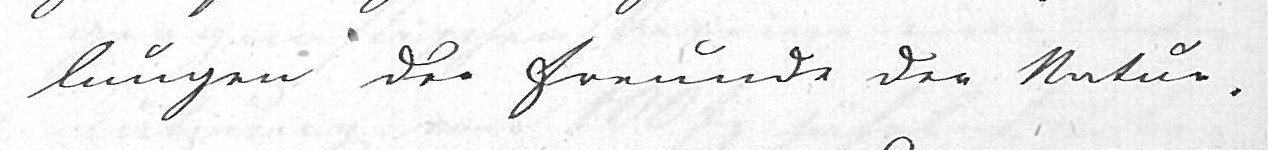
lungen der Freunde der Natur-
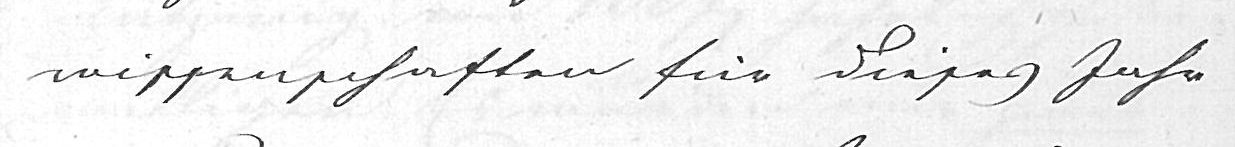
wissenschaften für dieses Jahr
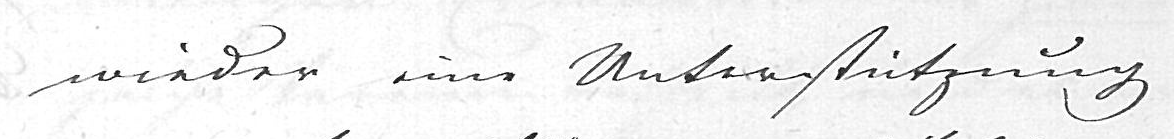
wieder eine Unterstützung
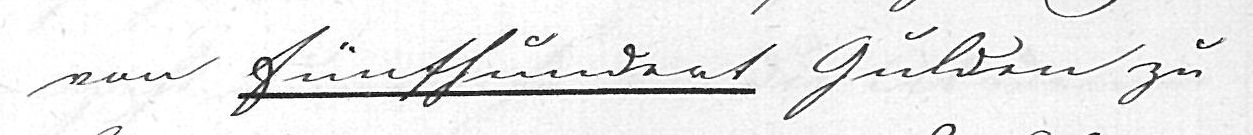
von Fünfhundert Gulden zu
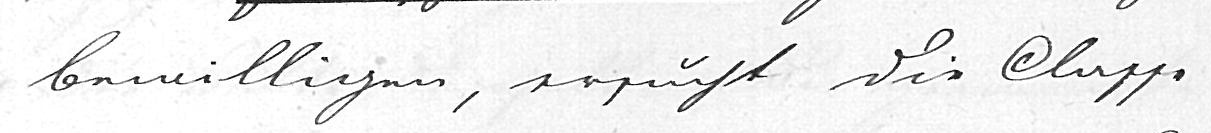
bewilligen, ersucht die Classe
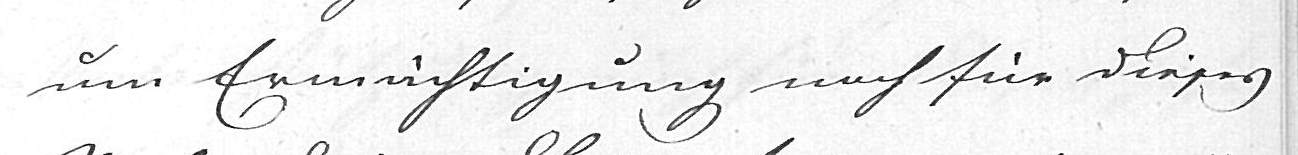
um Ermächtigung noch für dieses
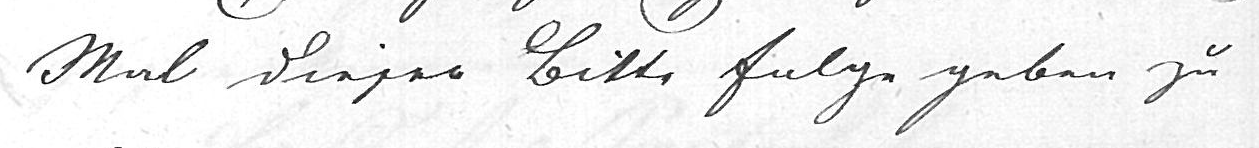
Mal dieser Bitte Folge geben zu
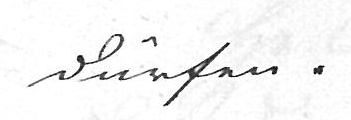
dürfen.
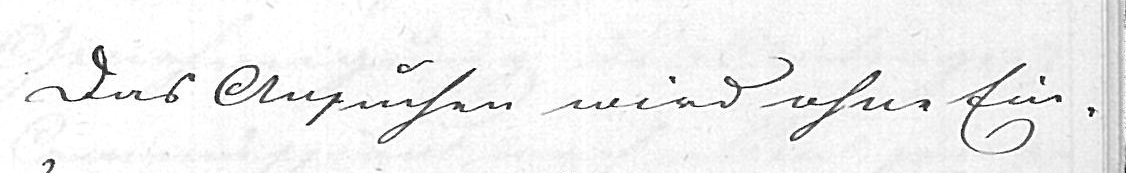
das Ansuchen wird ohne Ein-
